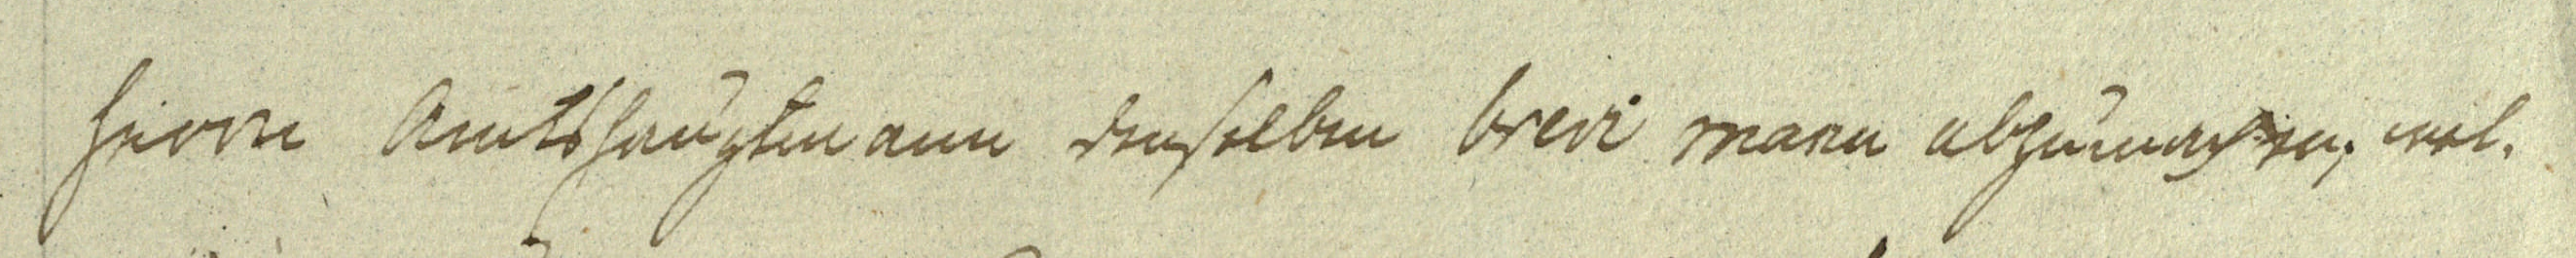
Herrn Amtshauptmann denselben brevi manu abzumachen, wel¬
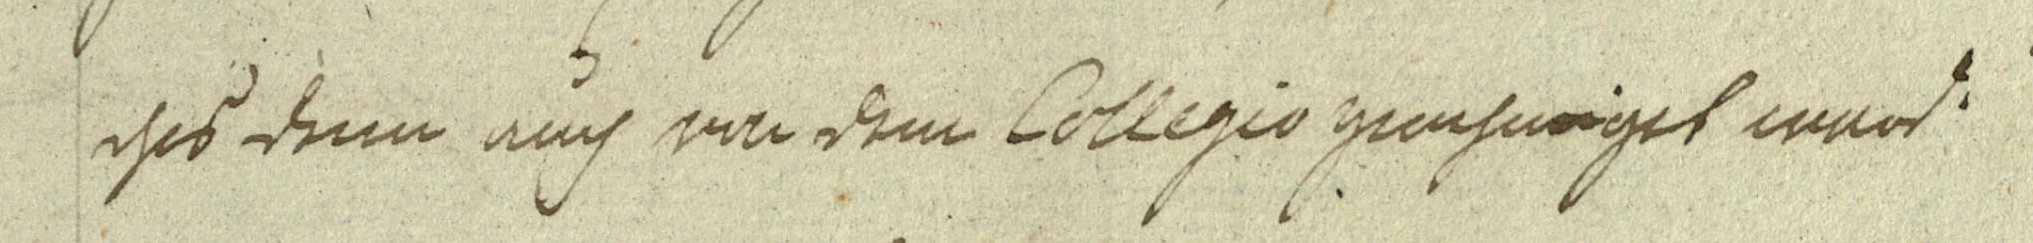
ches denn auch von dem Collegio genehmiget ward.
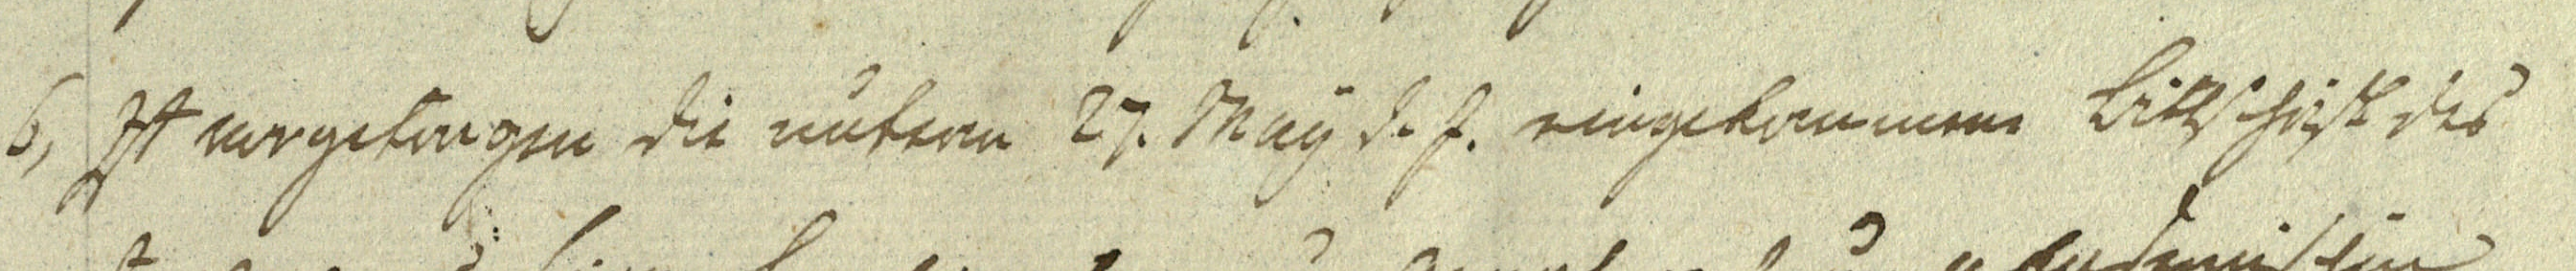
6, Ist vorgetragen die unterm 27. Maÿ d. J. eingekommene Bittschrift des
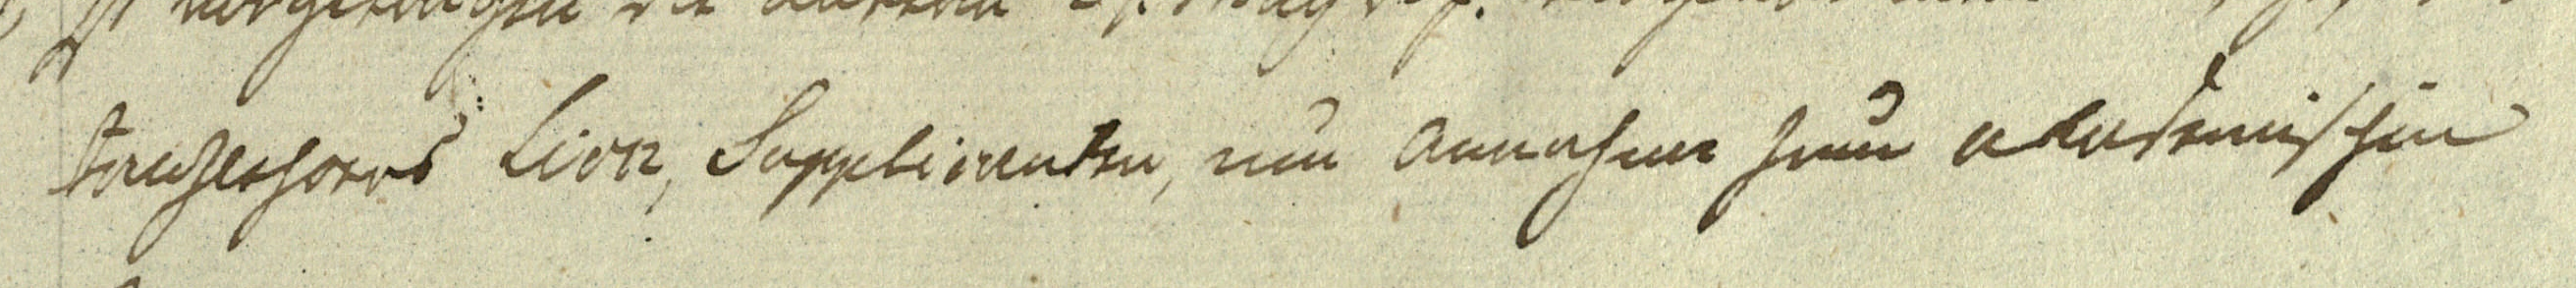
Tanzlehrers Lion, Supplicanten, um Annahme zum akademischen
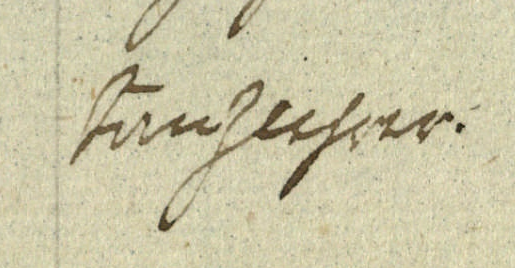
Tanzlehrer.
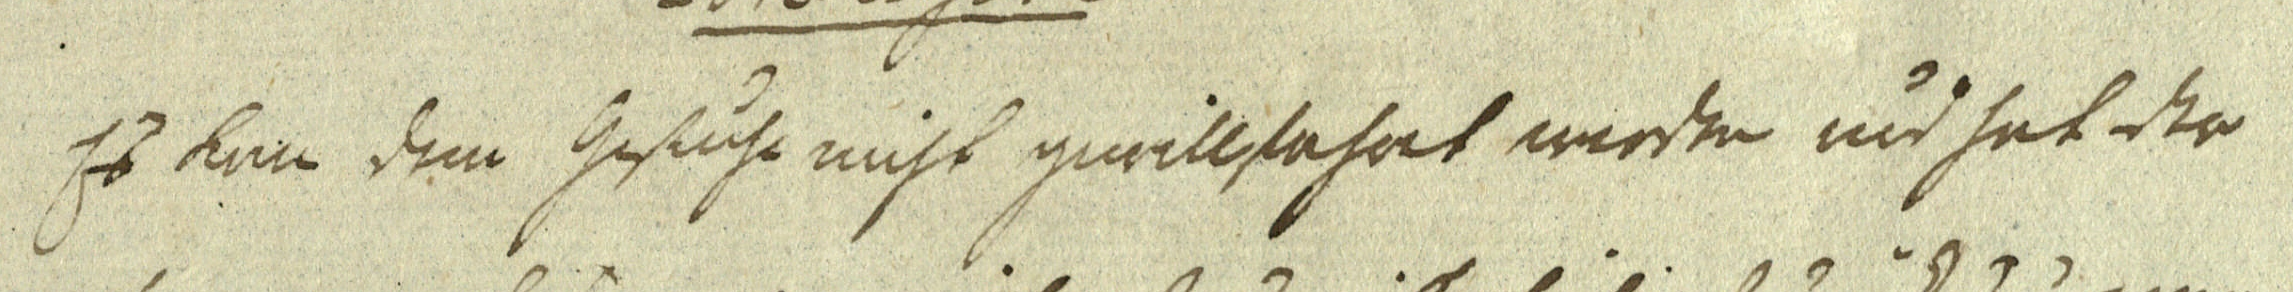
Es kann dem Gesuche nicht gewillfahret werden und hat der
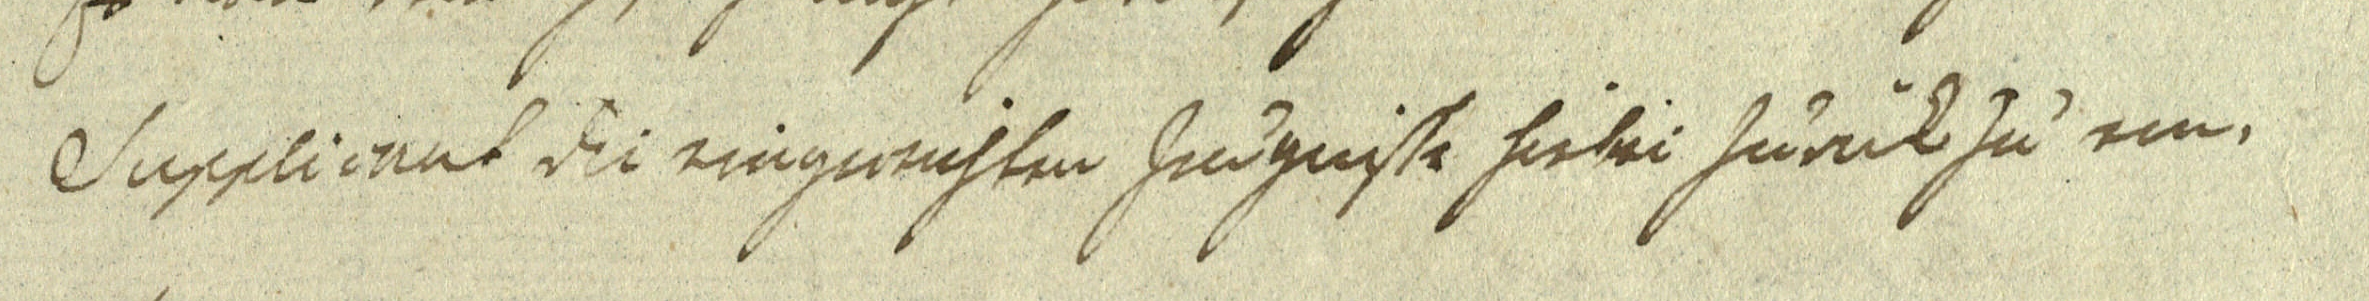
Supplicant die eingereichten Zeugnisse hiebei zurückzu em¬
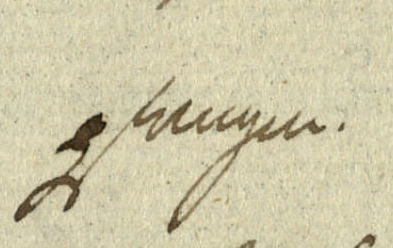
pfangen.
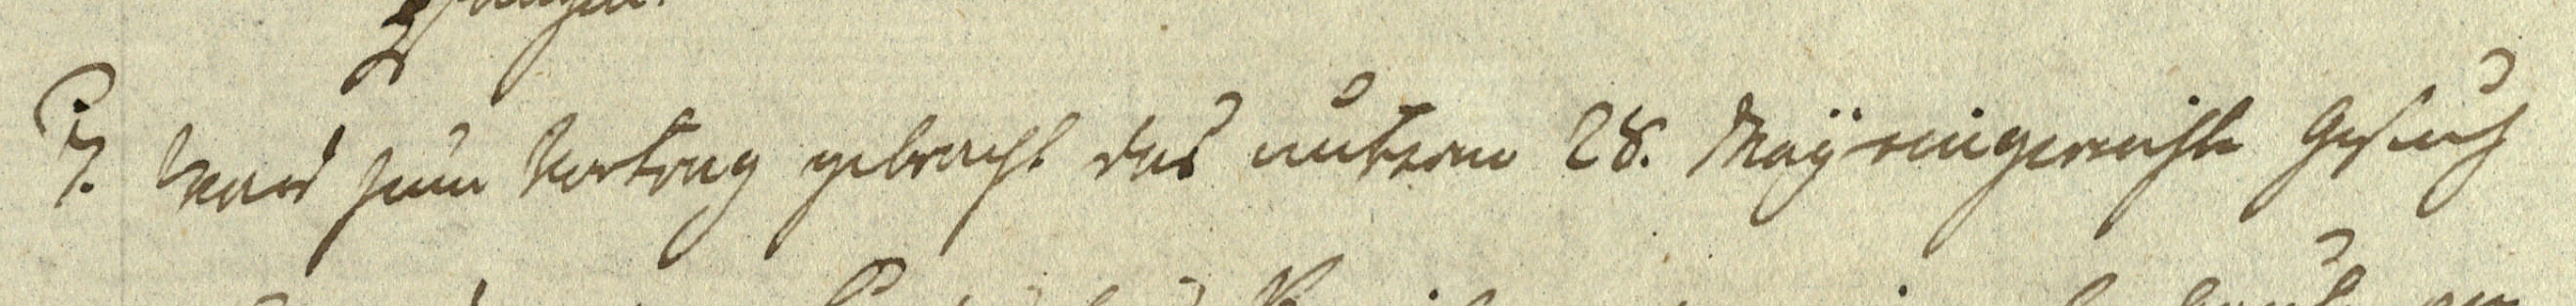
7. Ward zum Vortrag gebracht das unterm 28. Maÿ eingereichte Gesuch
